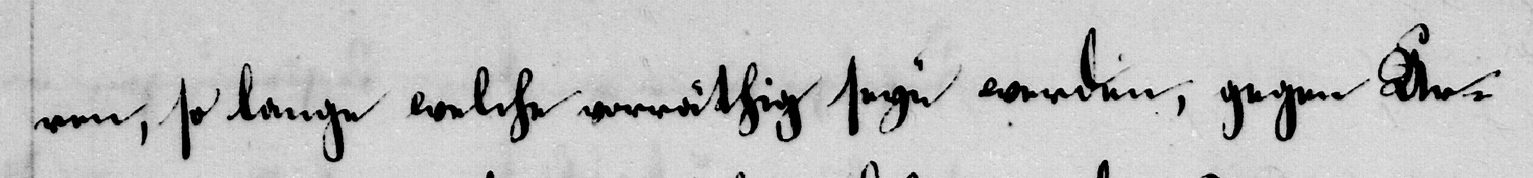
ren, so lange welche vorräthig seyn werden, gegen Ur¬
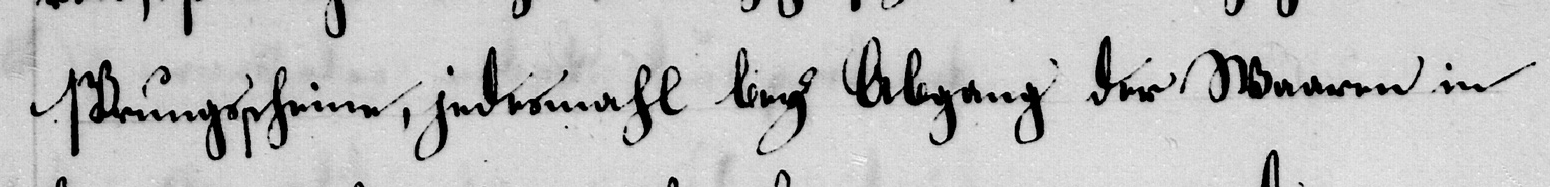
sprungsscheine, jedesmahl bey Abgang der Waaren in
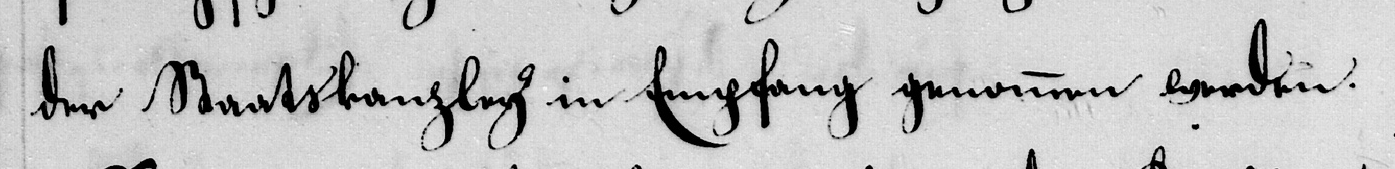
der Staatskanzley in Empfang genommen werden.
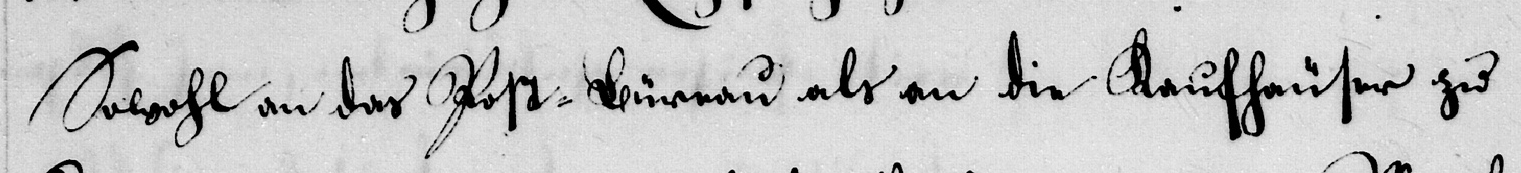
Sowohl an das Post-Büreau als an die Kaufhäuser zu
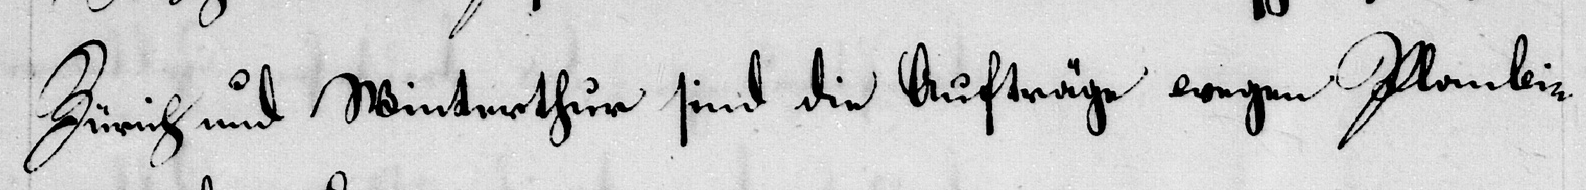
Zürich und Winterthur sind die Aufträge wegen Planki¬
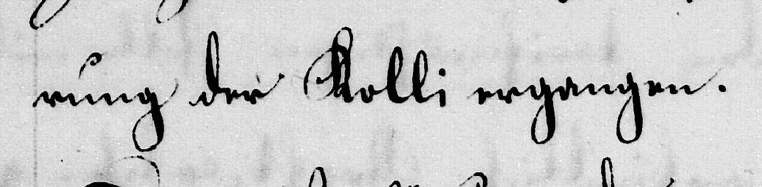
rung der Kolli ergangen.
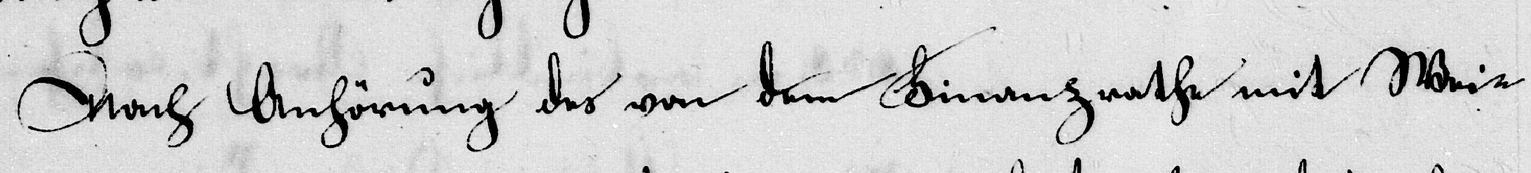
Nach Anhörung des von dem Finanzrathe mit Wei¬
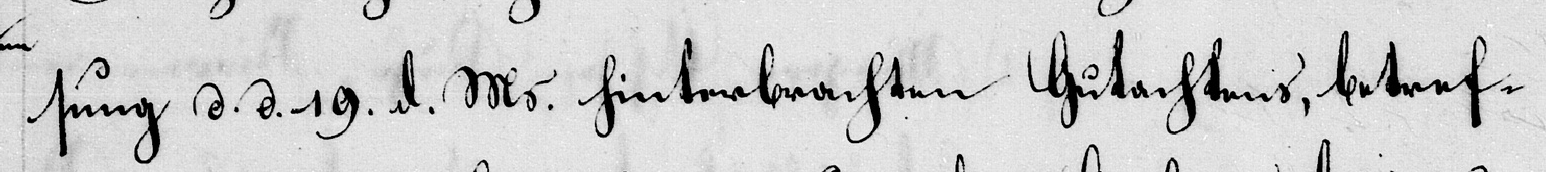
sung d. d. 19. d. Ms. hinterbrachten Gutachtens, betref¬
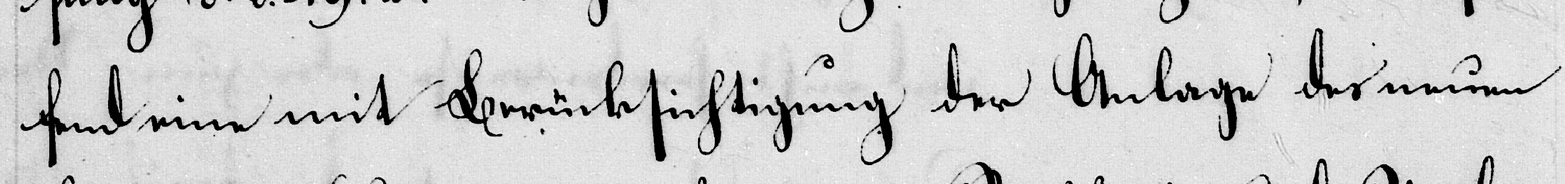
fend eine mit Berücksichtigung der Anlage des neuen
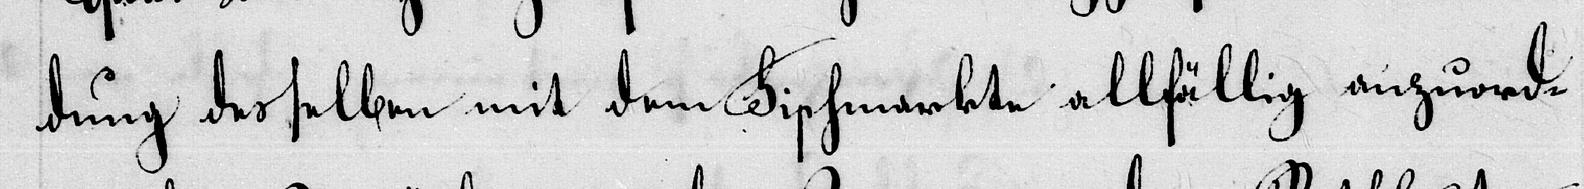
dung desselben mit dem Fischmarkte allfällig anzuord¬
